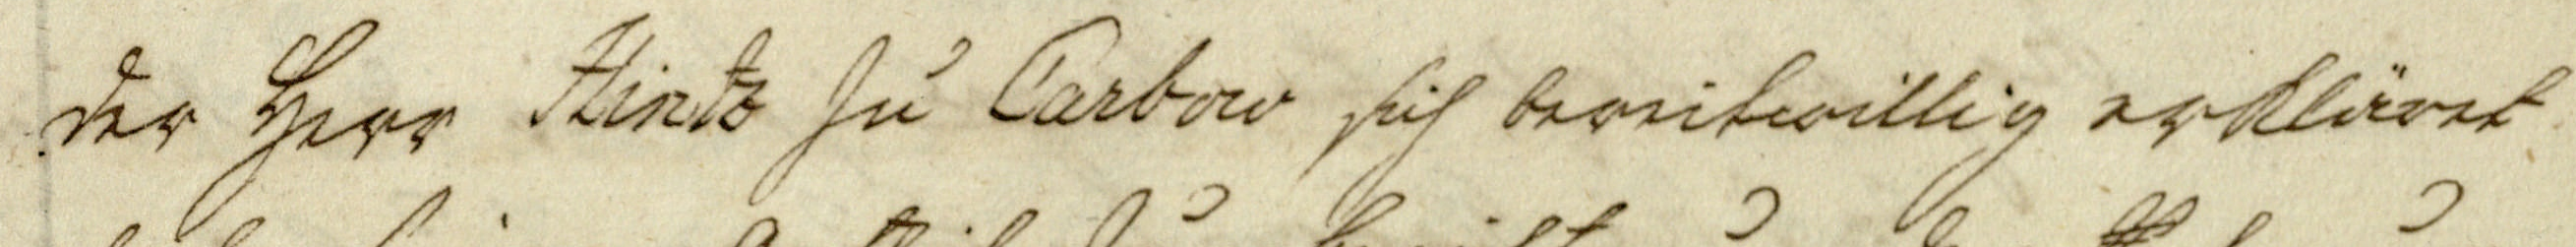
der Herr Hintz zu Carbow sich bereitwillig erkläret
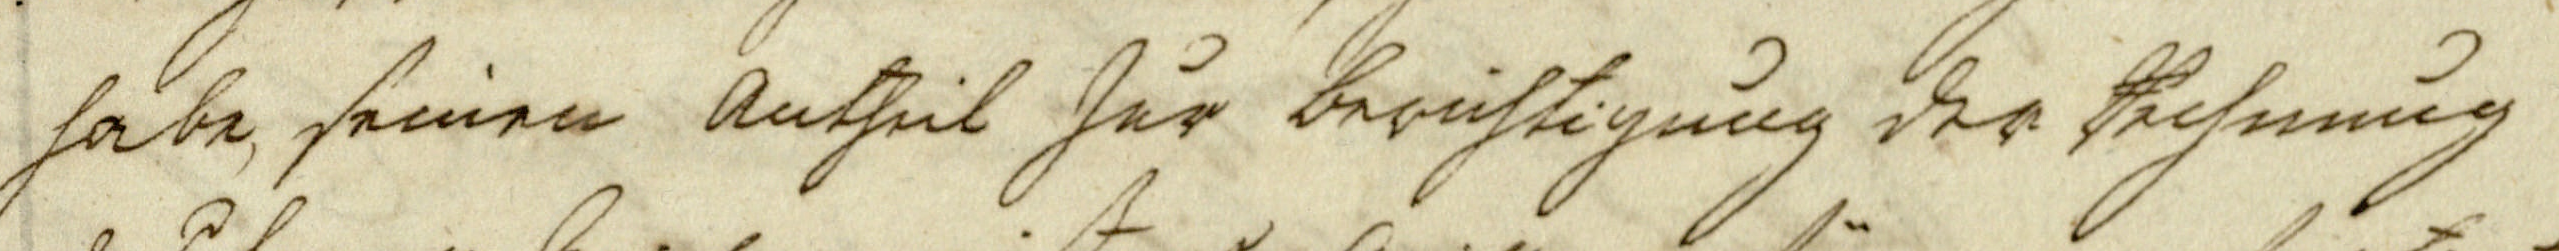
habe, seinen Antheil zur Berichtigung der Rechnung
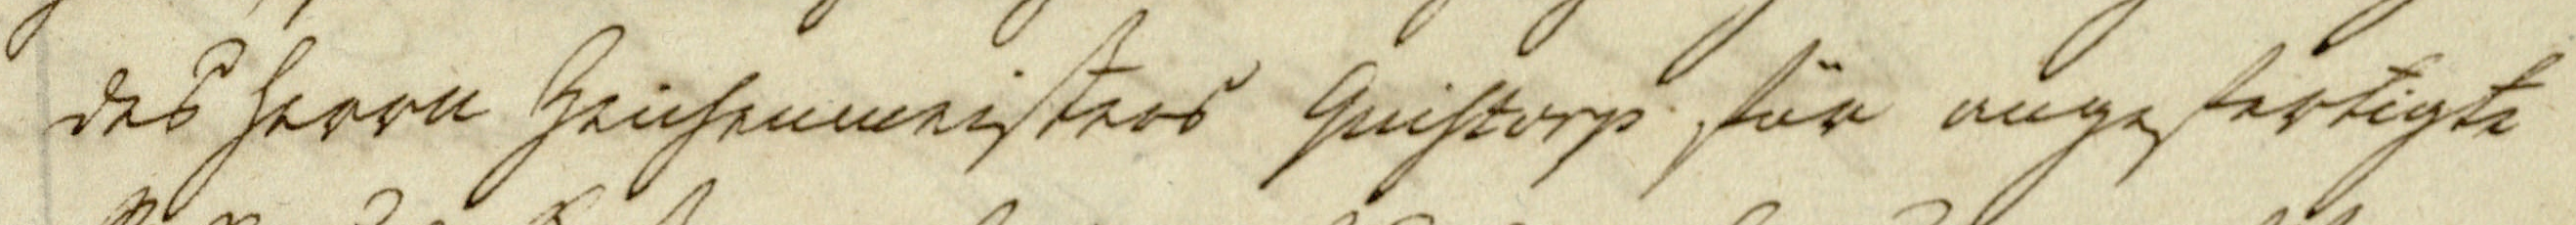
des herrn Zeichenmeisters Quistorp für angefertigte
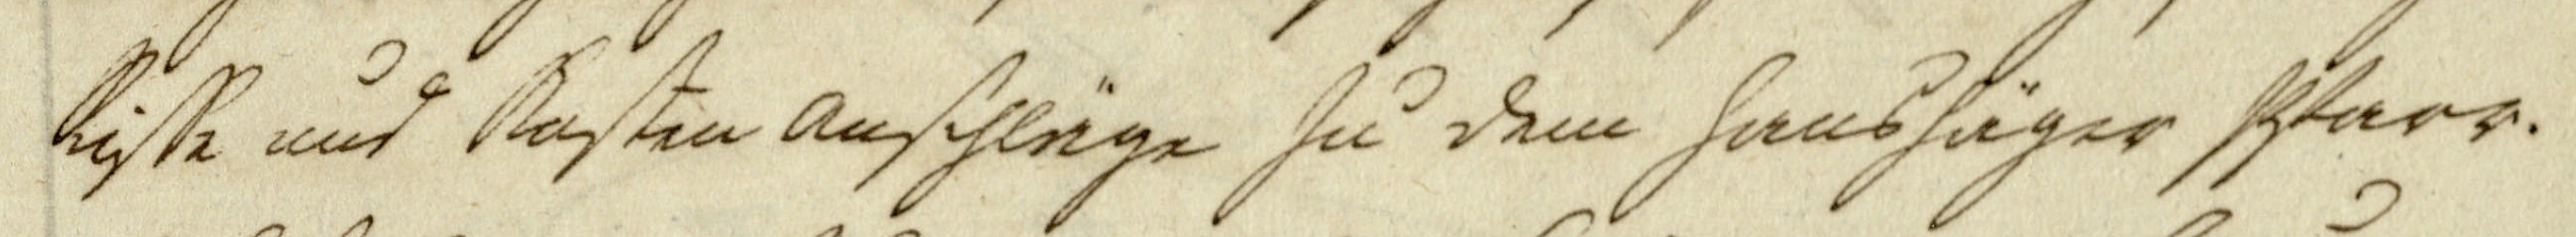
Risse und Kosten Anschläge zu dem Hanshäger Pfarr¬
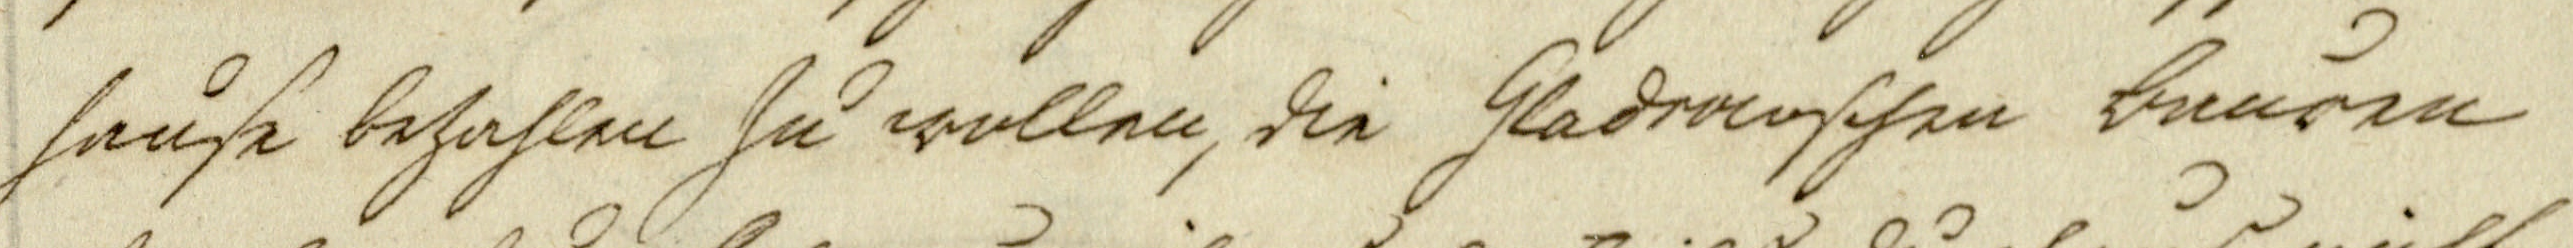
hause bezahlen zu wollen, die Gladrowschen Bauren
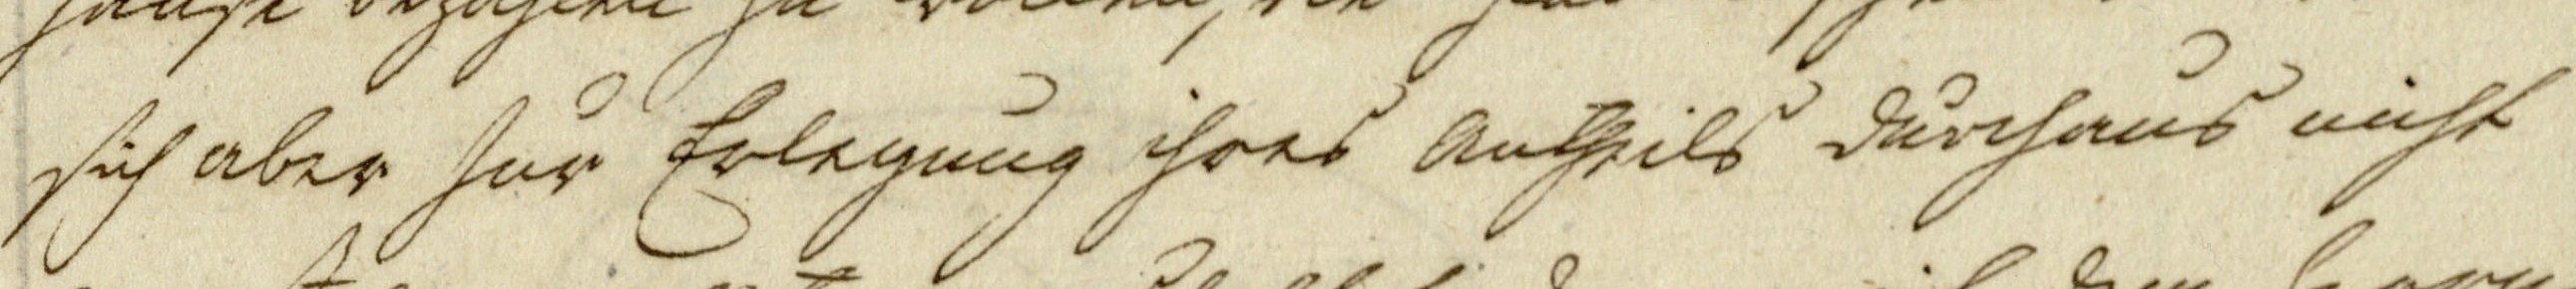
sich aber zur Erlegung ihres Antheils durchaus nicht
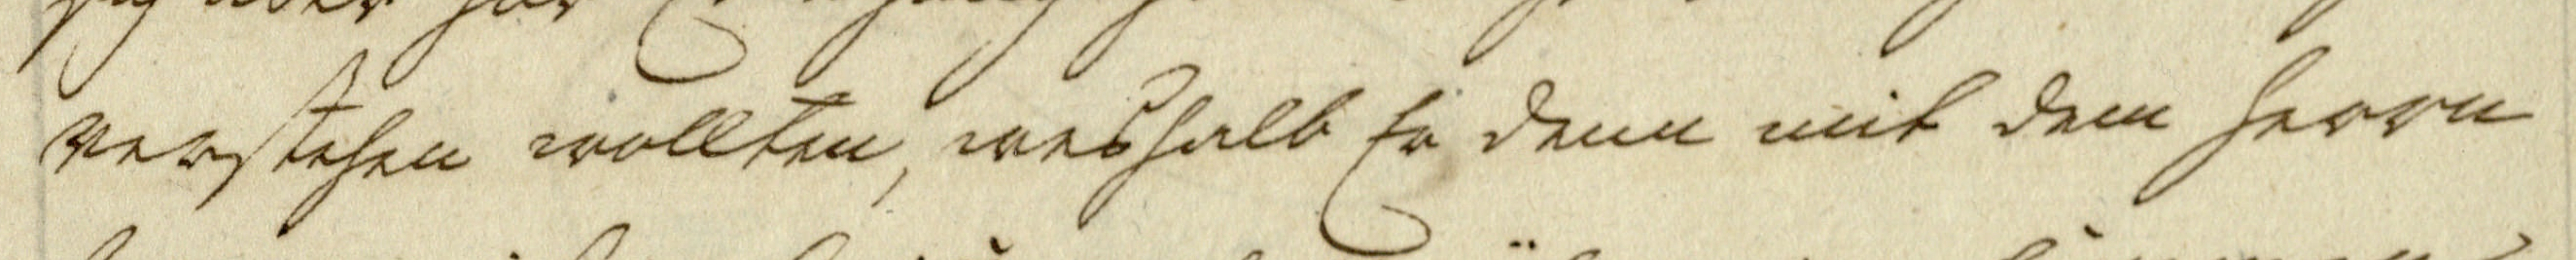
verstehen wollten, weshalb Er denn mit dem herrn
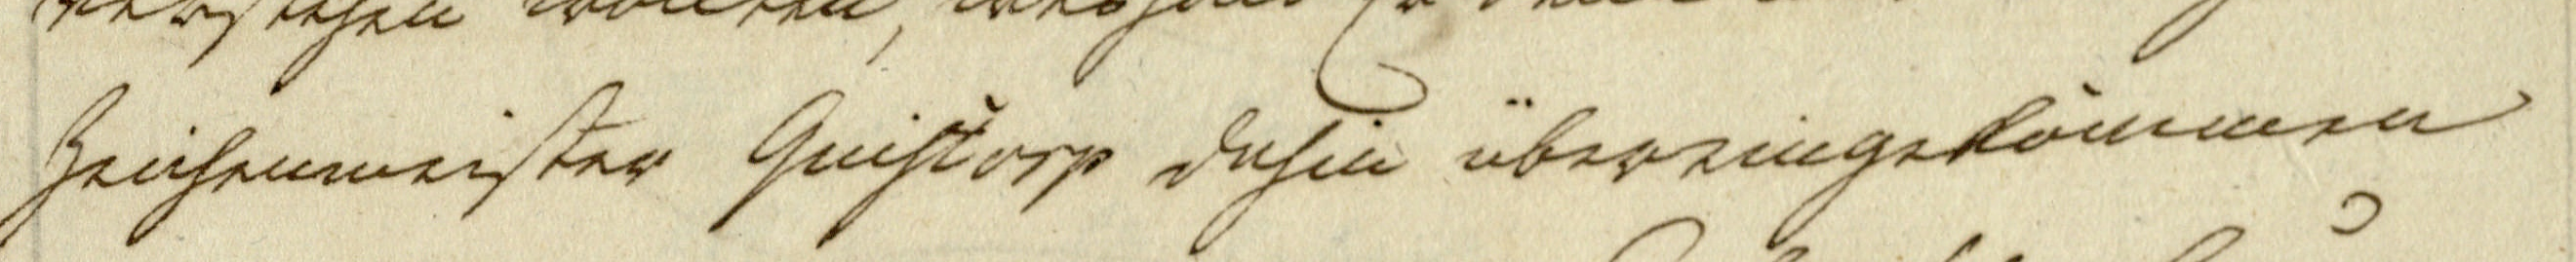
Zeichenmeister Quistorp dahin übereingekommen
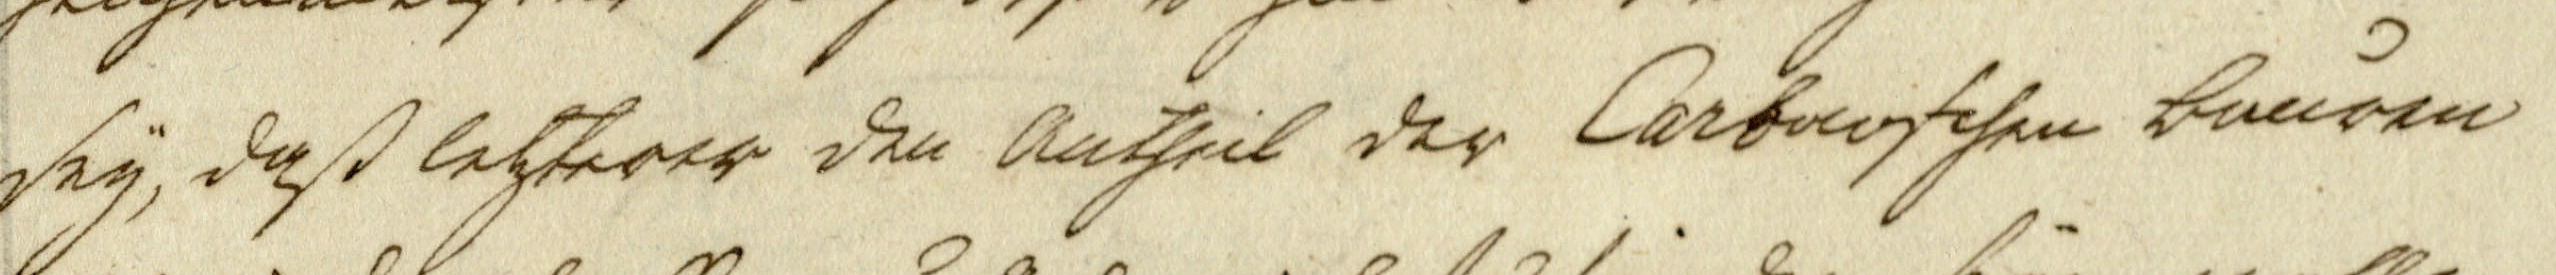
seÿ, daß letzterer den Antheil der Carbowschen Bauren
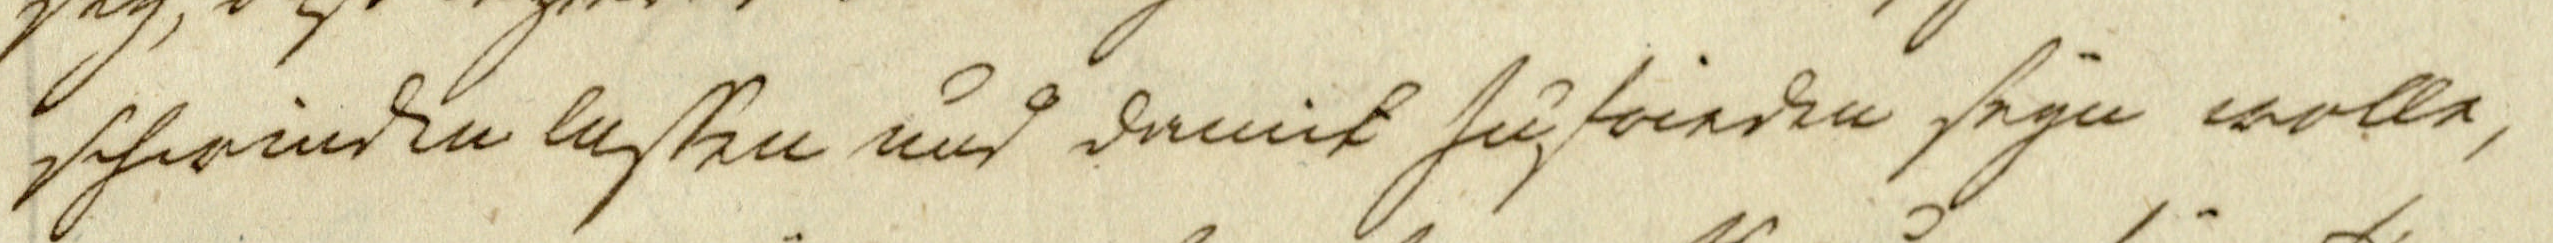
schwinden lassen und damit zufrieden seÿn wolle,
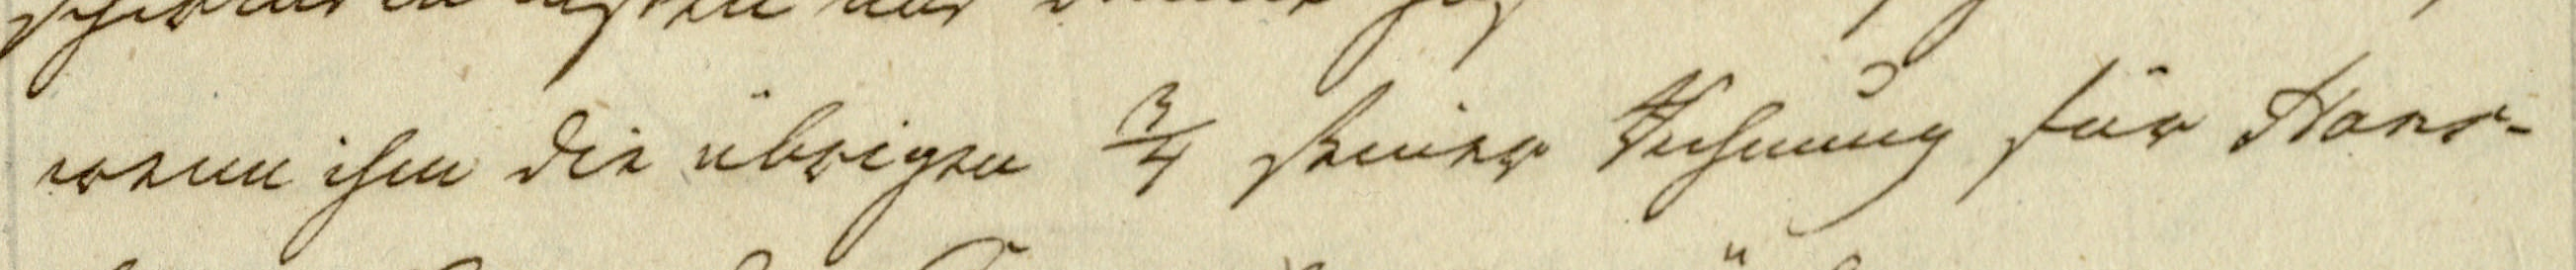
wenn ihm die übrigen ¾ seiner Rechnung für Hans¬
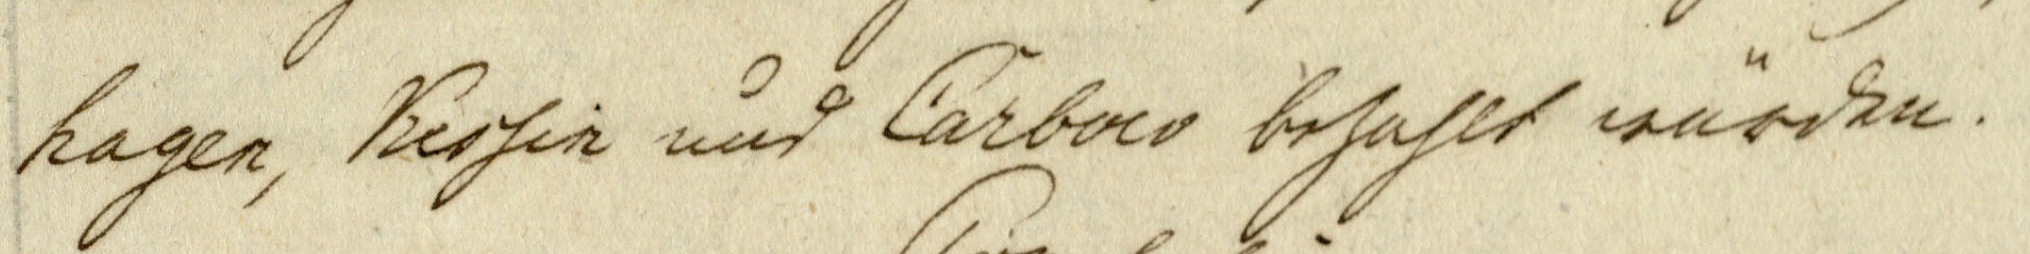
hagen, Kessin und Carbow bezahlt würden.
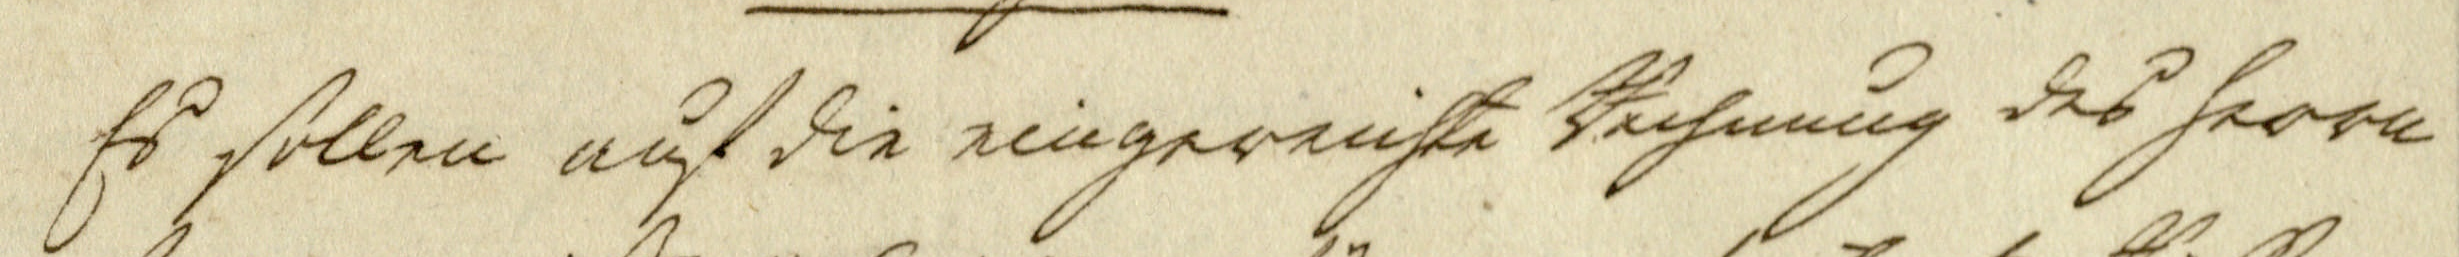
Es sollen auf die eingereichte Rechnung des herrn
